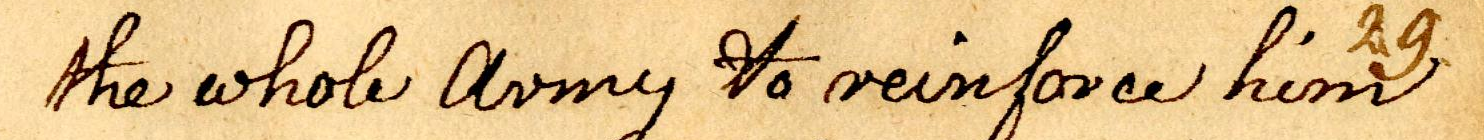the whole Army to reinforce him
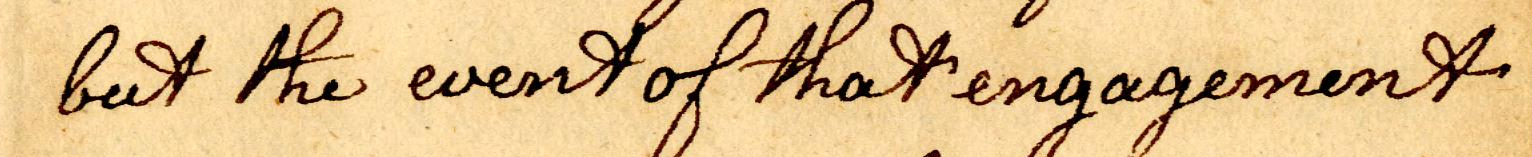but the event of that engagement
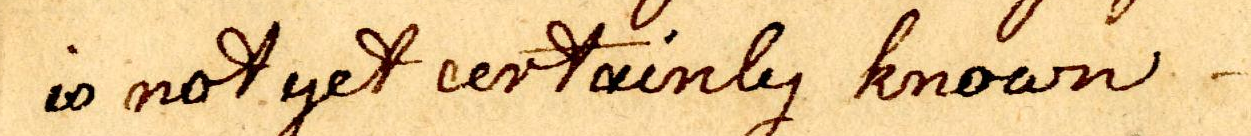is not yet certainly known
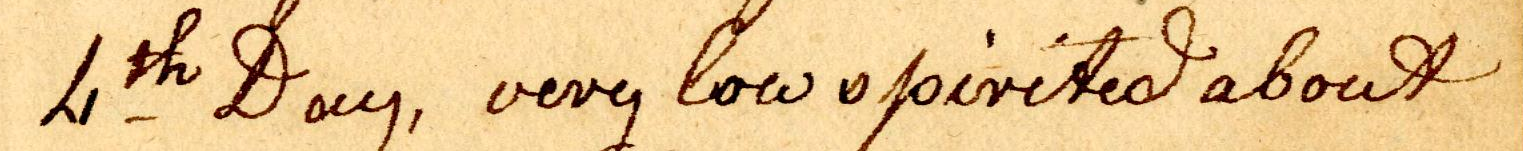4^th Day, very low spirited about
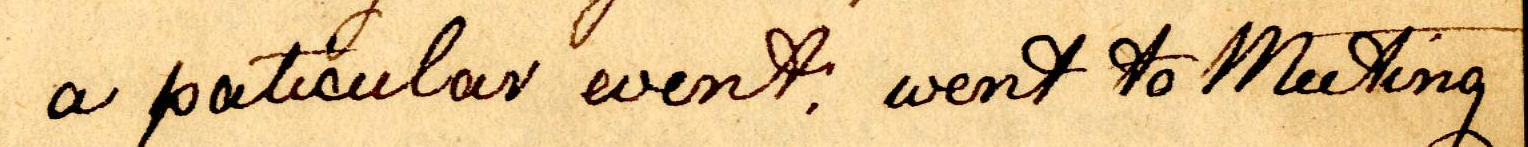a paticular event, went to Meeting
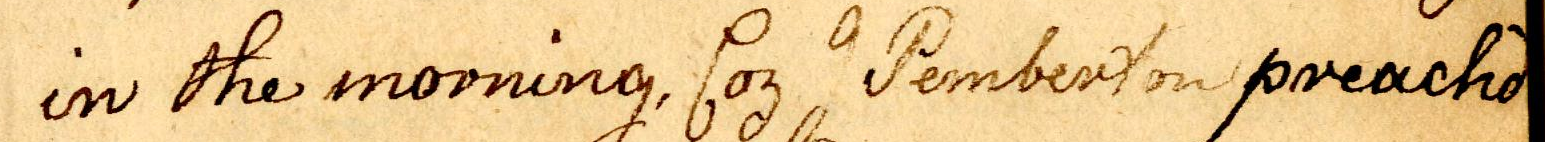in the morning, Coz J Pemberton preachd
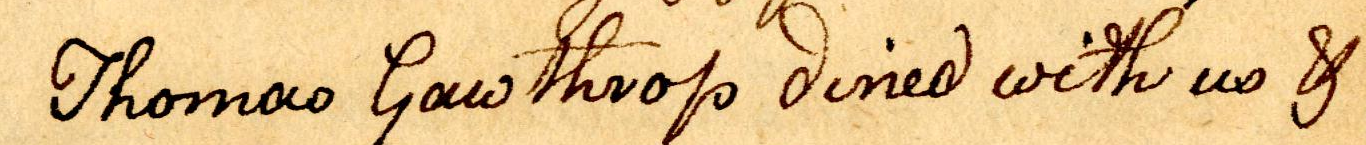Thomas Gawthrop dined with us &
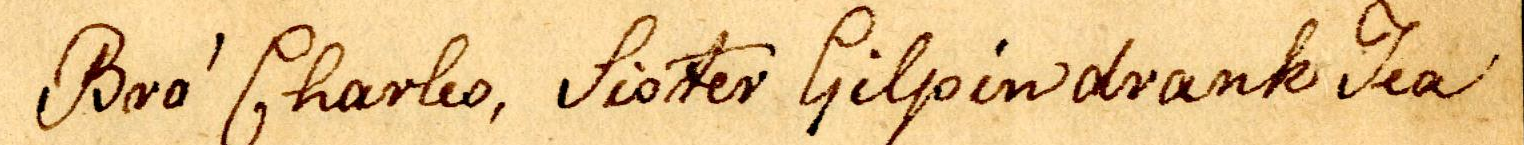Bro' Charles, Sister Gilpin drank Tea
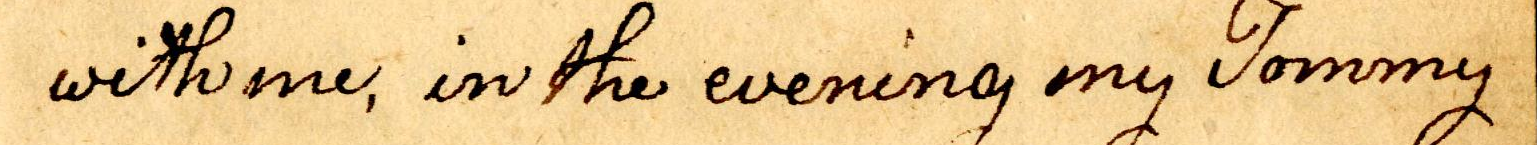with me, in the evening my Tommy
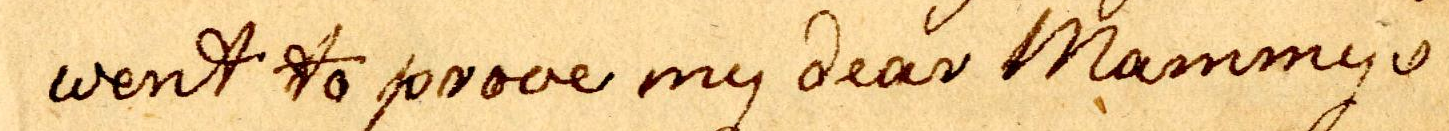went to prove my dear Mammy's
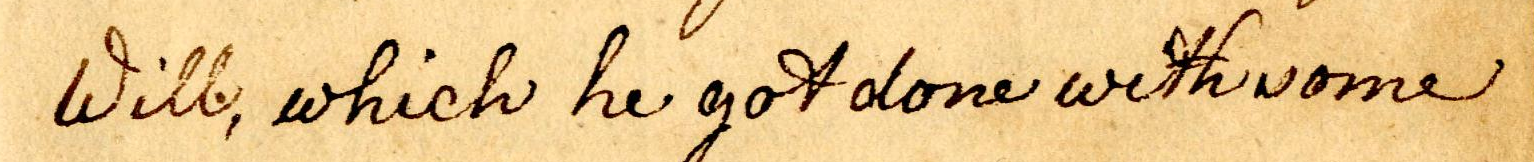Will, which he got done with some
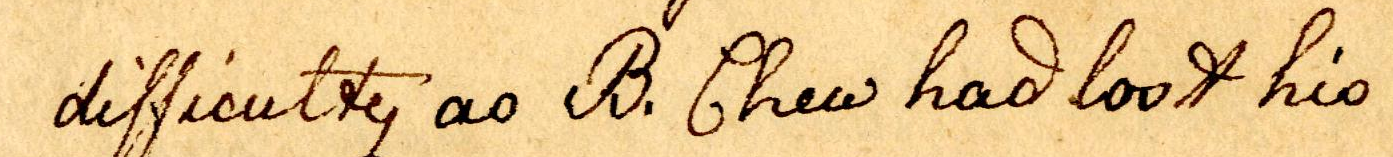difficulty as B. Chew had lost his
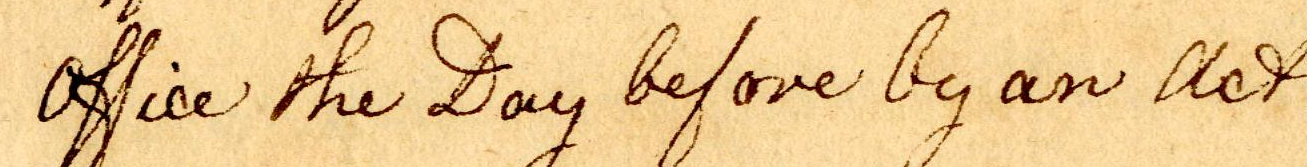Office the Day before by an Act
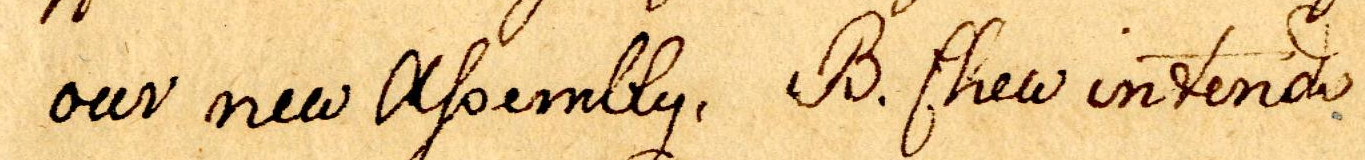our new Assembly. B. Chew intends
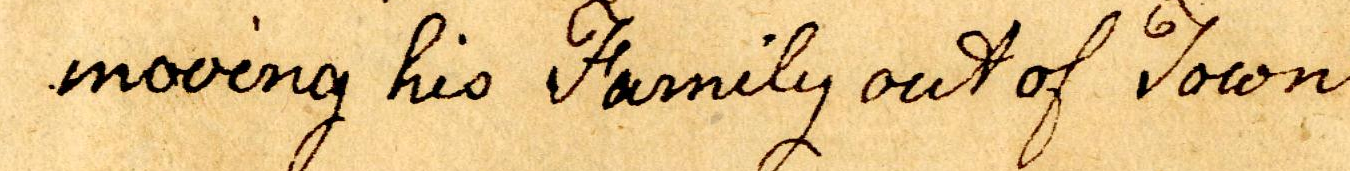moving his Family out of Town
